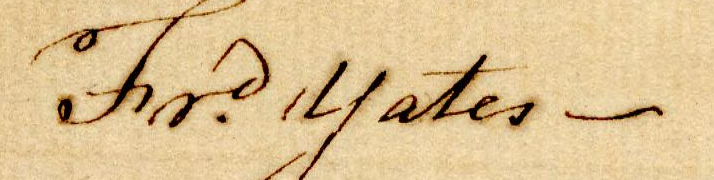Fr^d. Yates
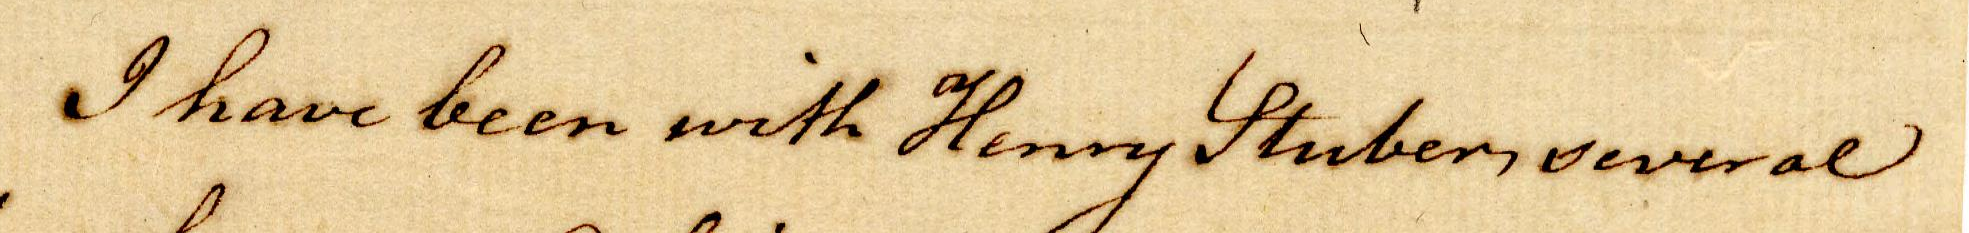I have been with Henry Stuber several
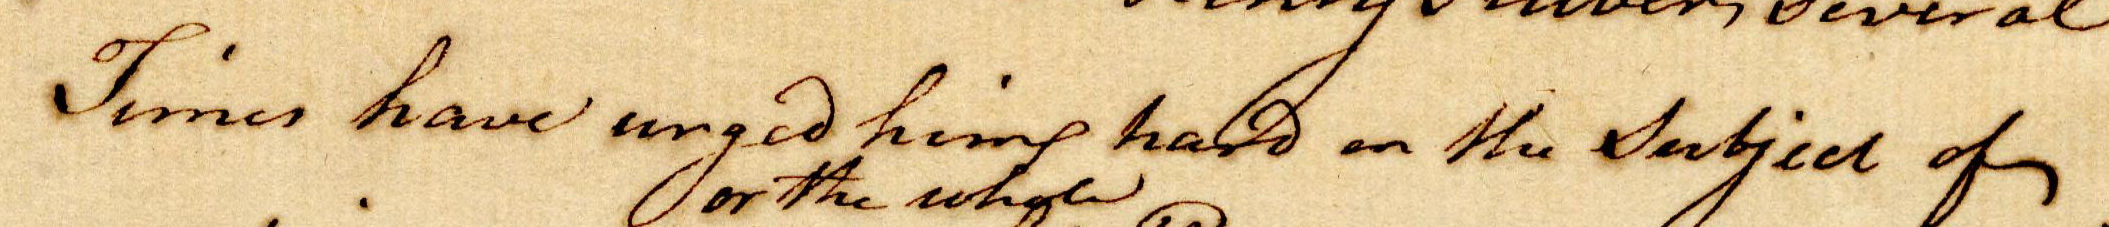Times have urged him hard in the Subject of
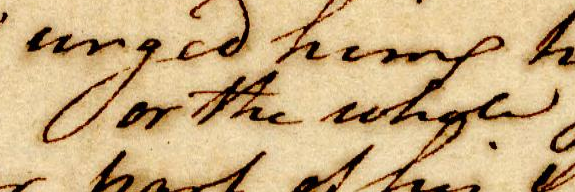or the whole
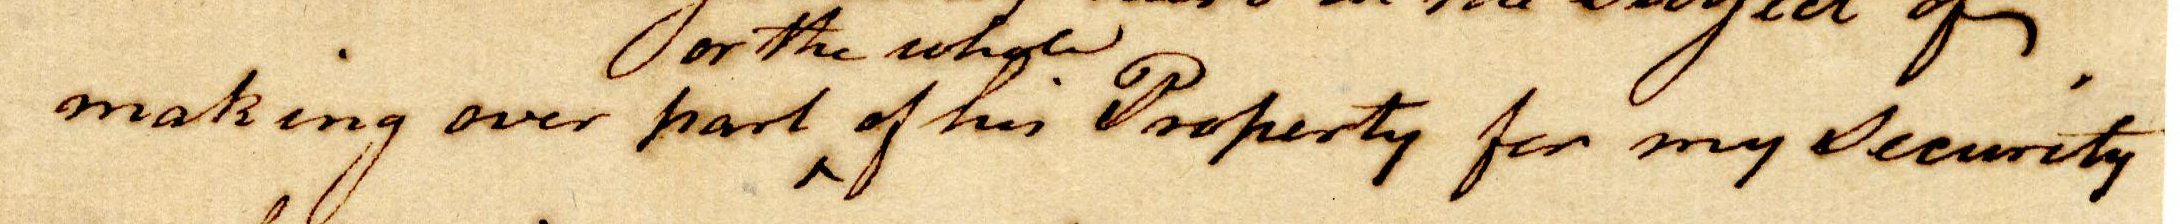making over part ^ of his Property for my security
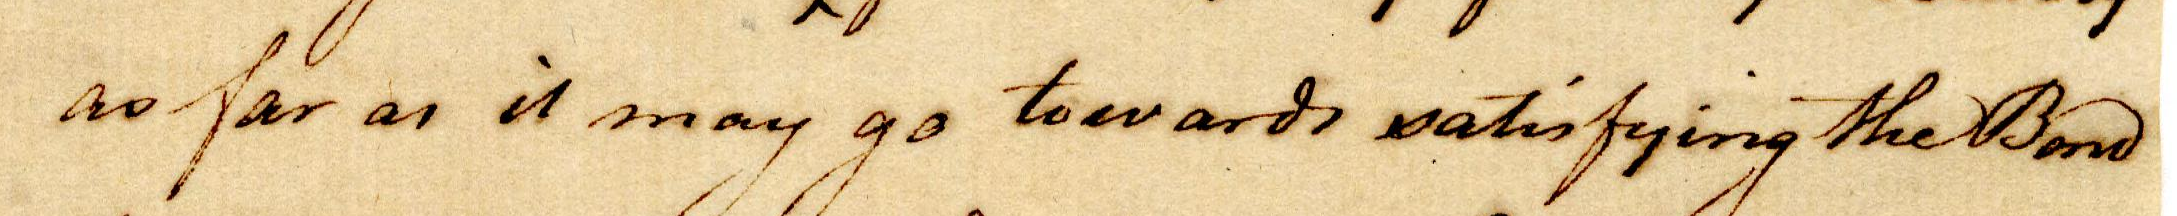as far as it may go towards satisfying the Bond
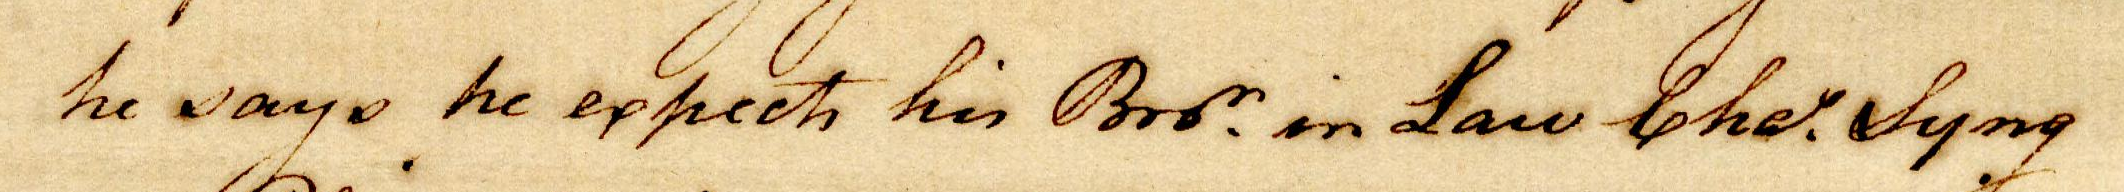he says he expects his Bro^r. in Law Cha^s. Syng
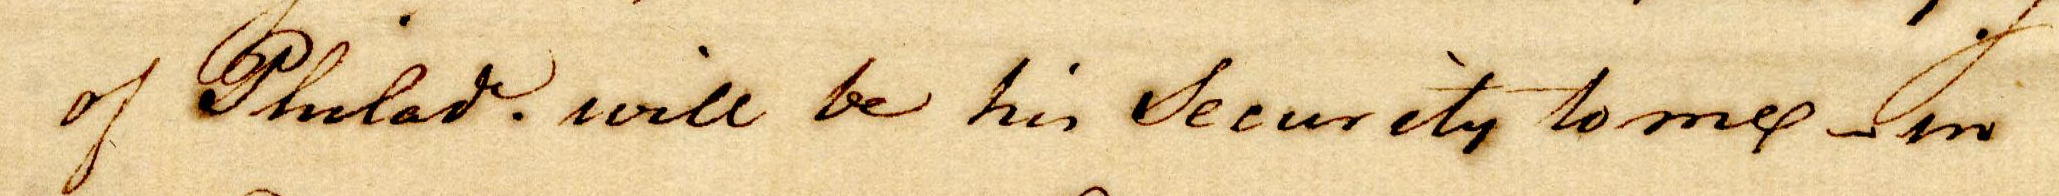of Philad^a will be his Security to me. in
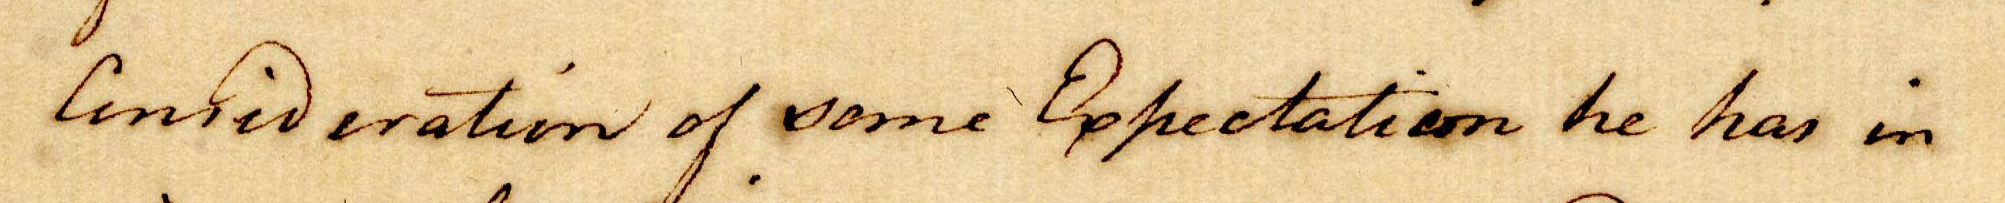Consideration of some Expectation he has in
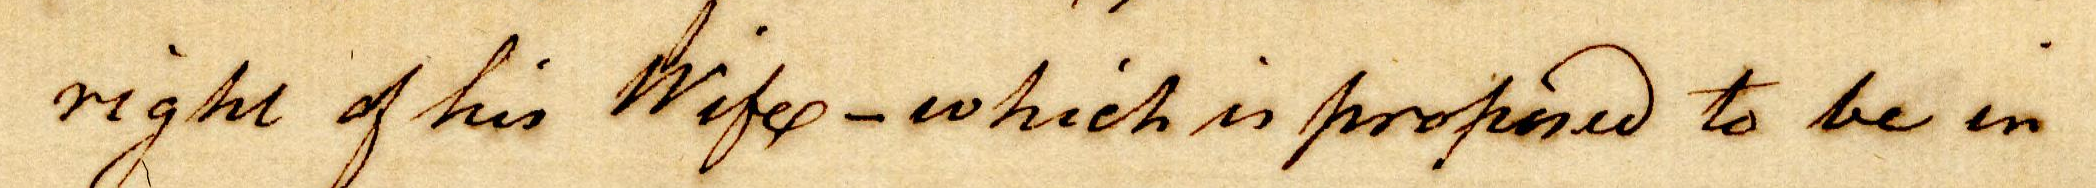right of his Wife, which is proposed to be in
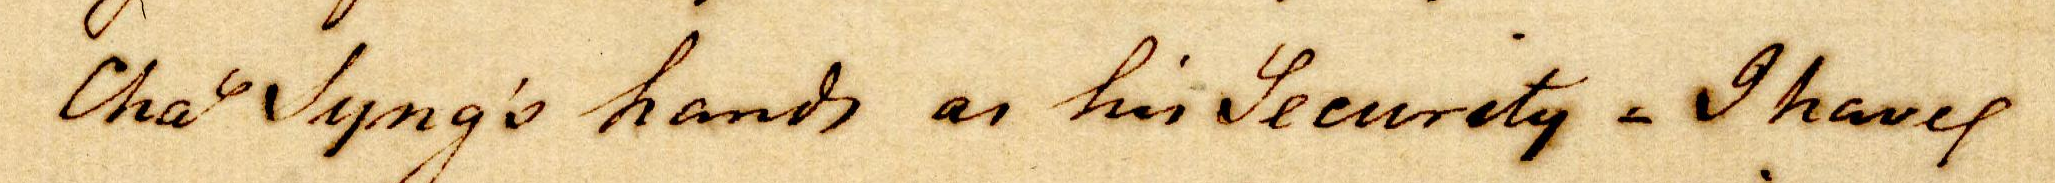Cha^s Syng's hands as his Security. I have
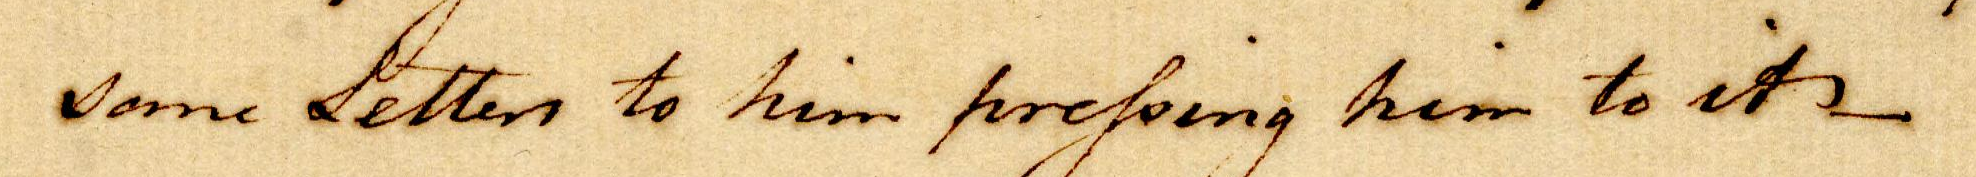some Letters to him pressing him to it
